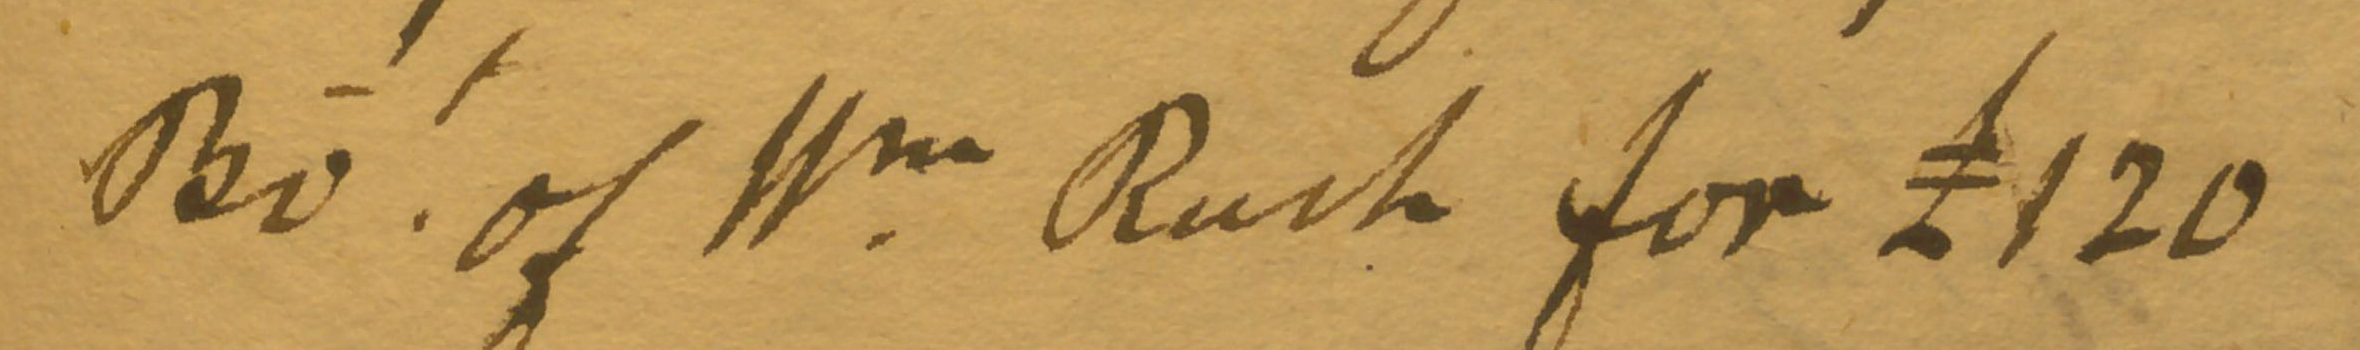Bo^t. of W^m. Rush for £120
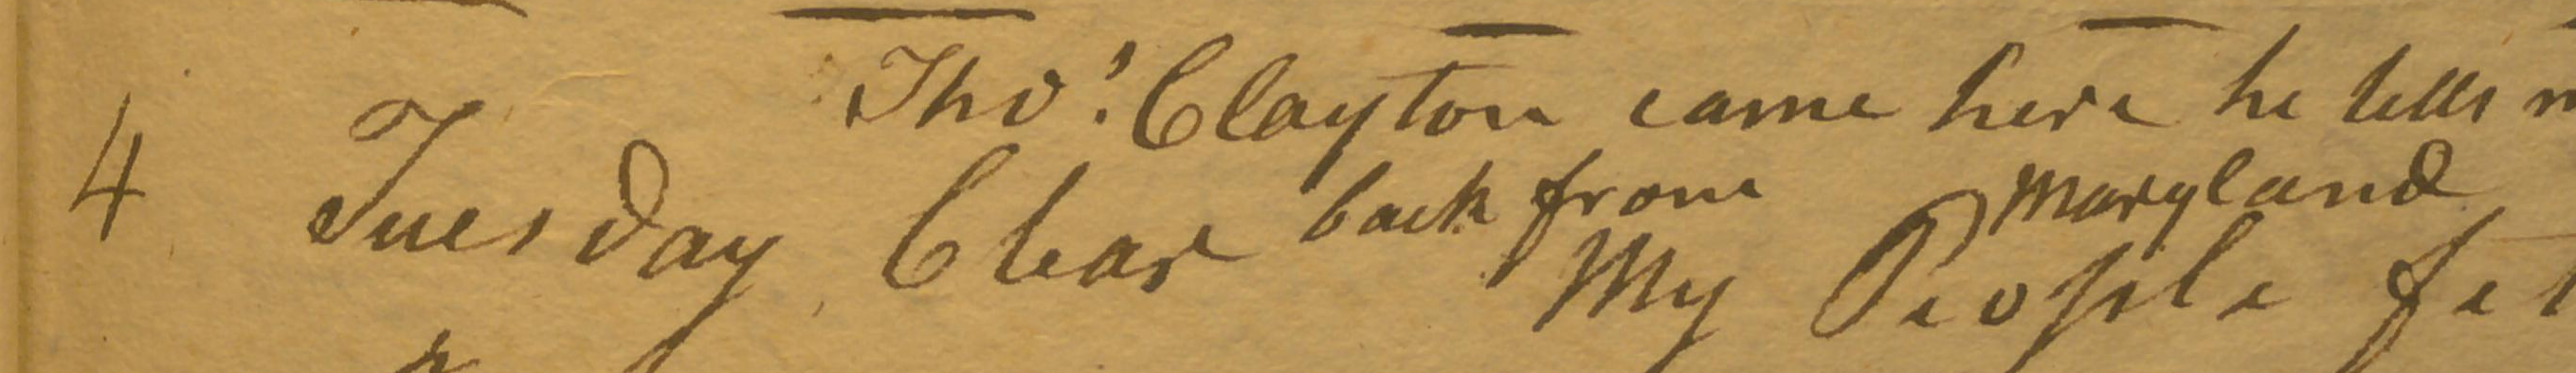4 Tuesday Clear back from maryland
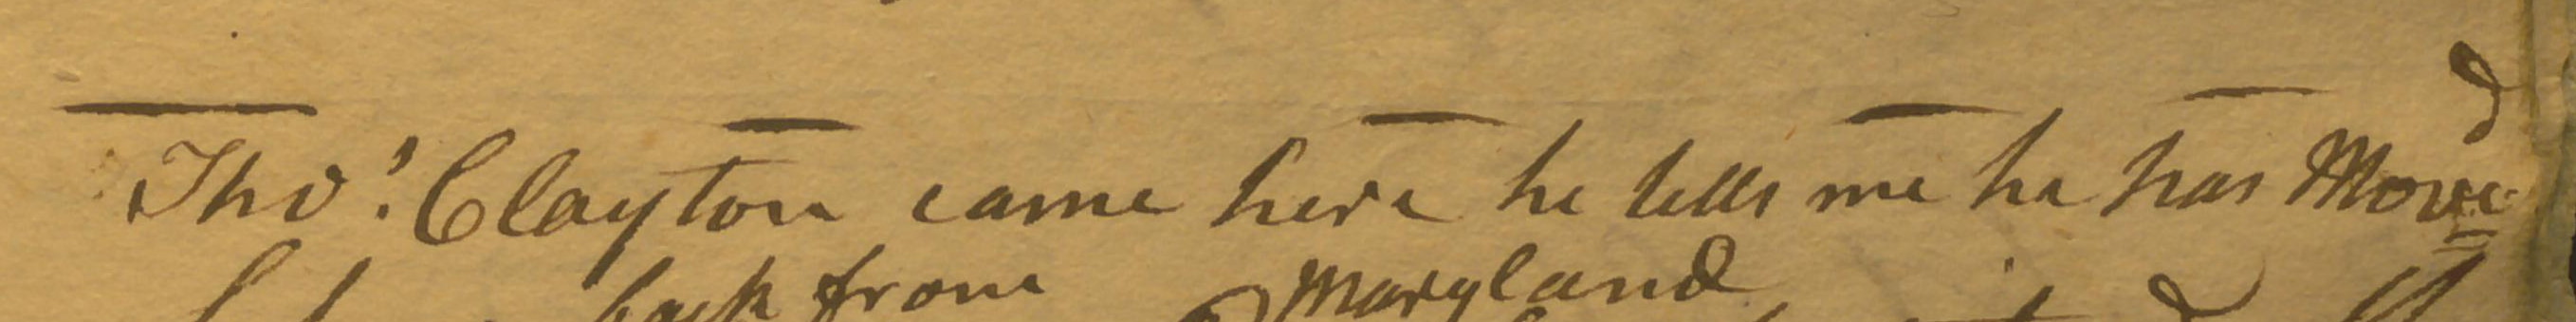Tho^s. Clayton came here he tells me he has Move^d
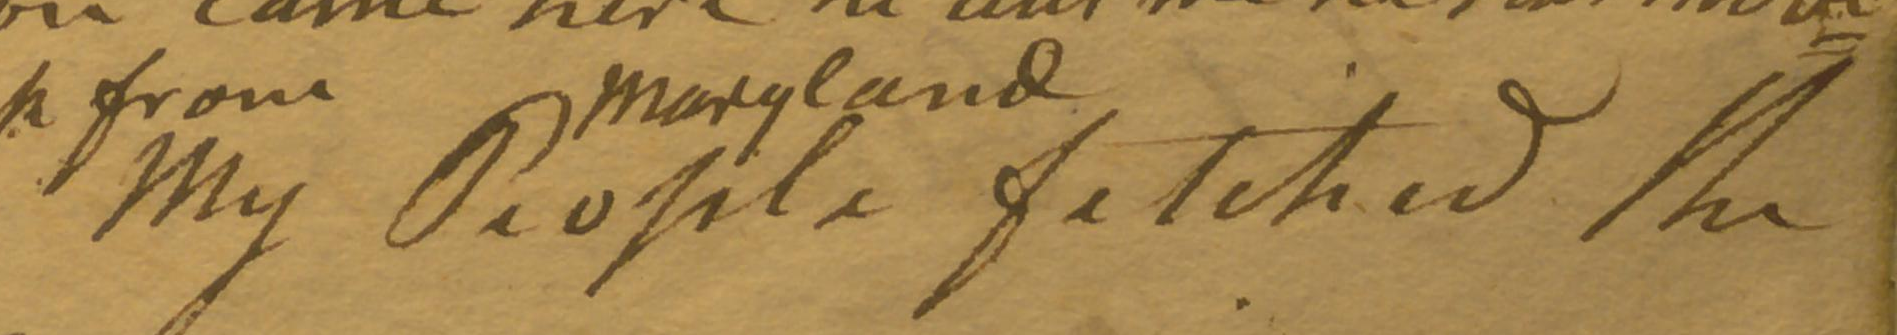My People fetched the
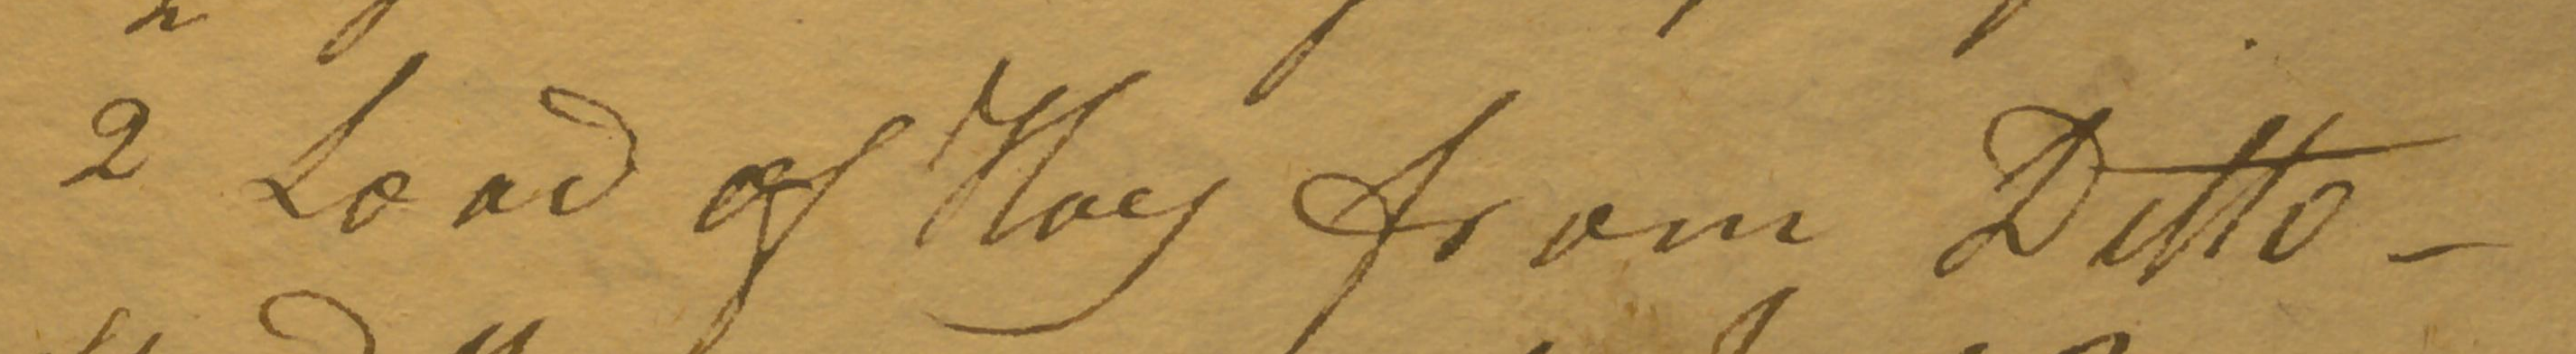2^h Load of Hay from Ditto-
